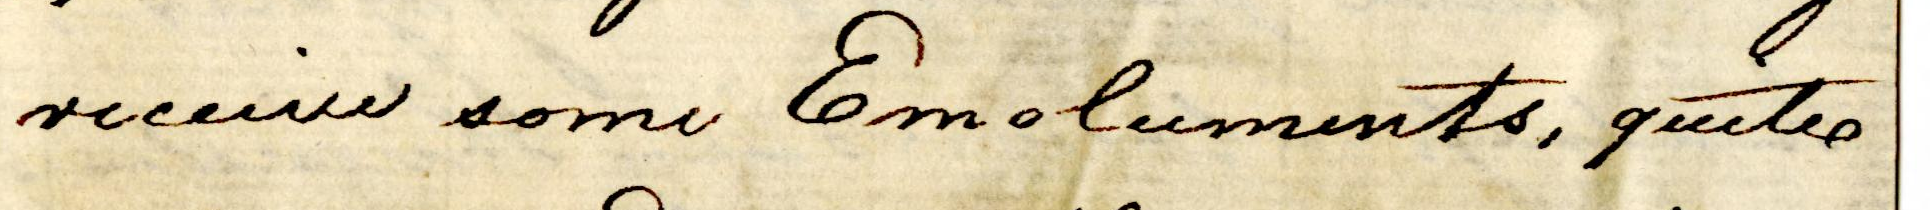receive some Emoluments, quite
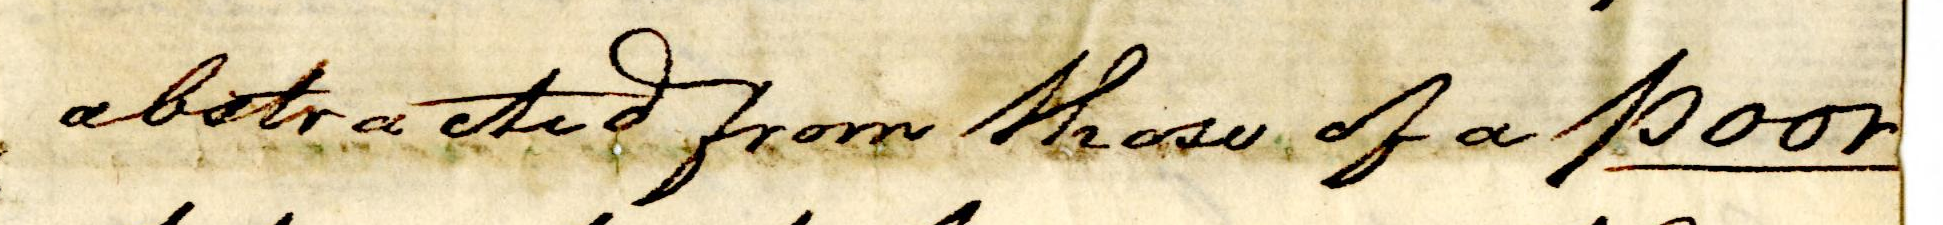abstracted from those of a poor
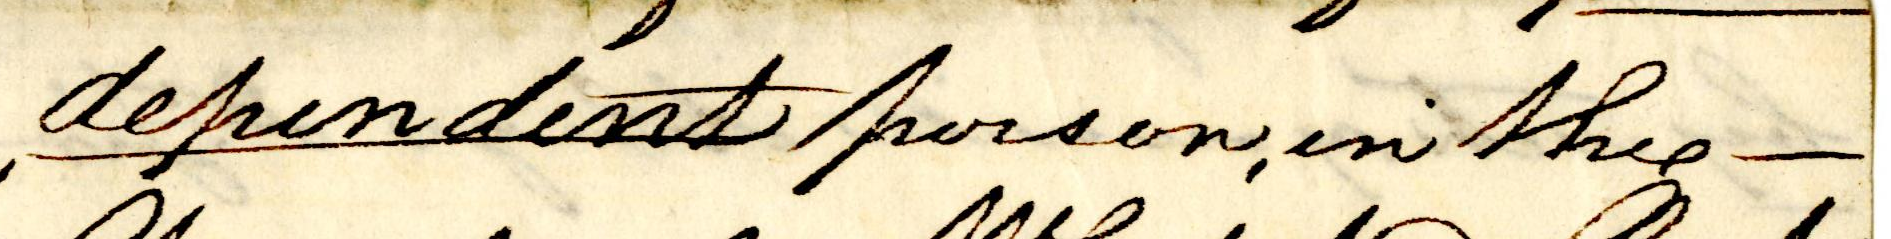dependent person, in the-
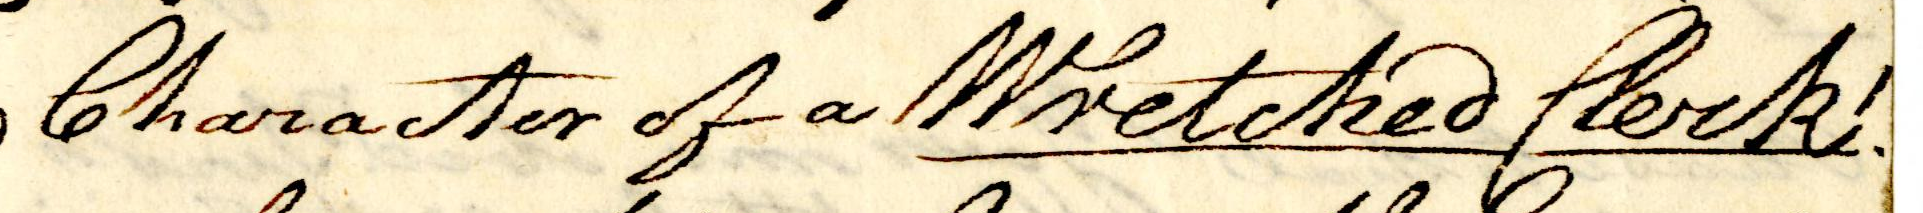Character of a Wretched Clerk!
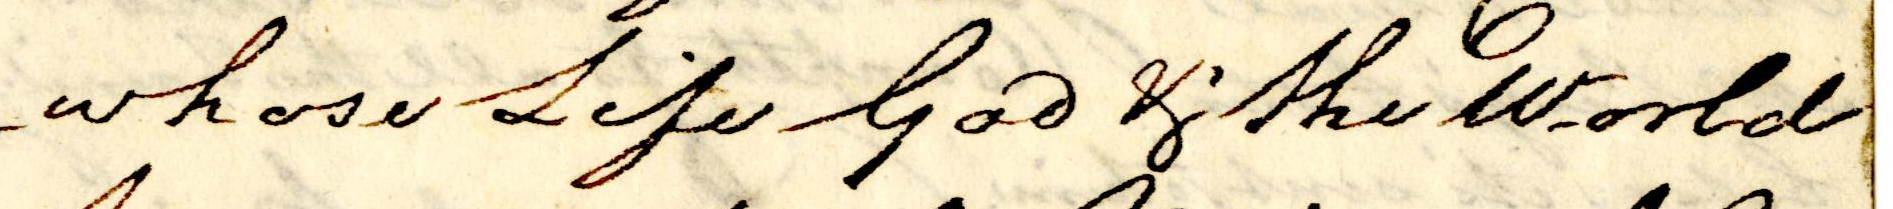whose Life God & the World
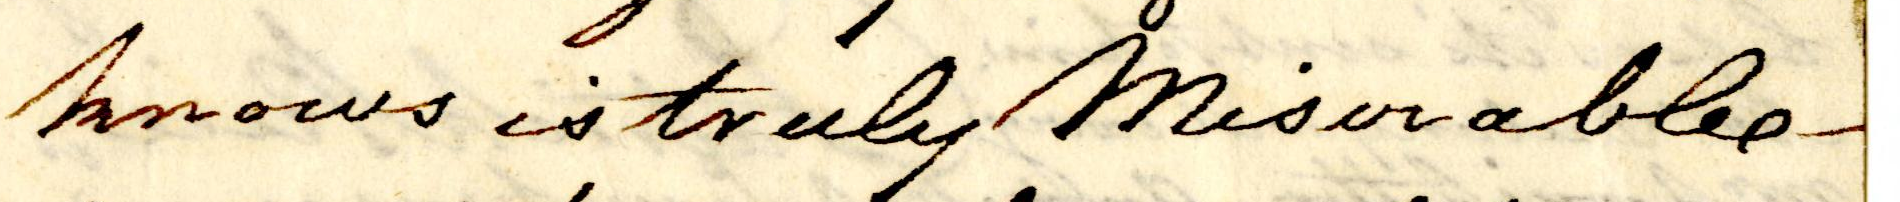knows is truly miserable-
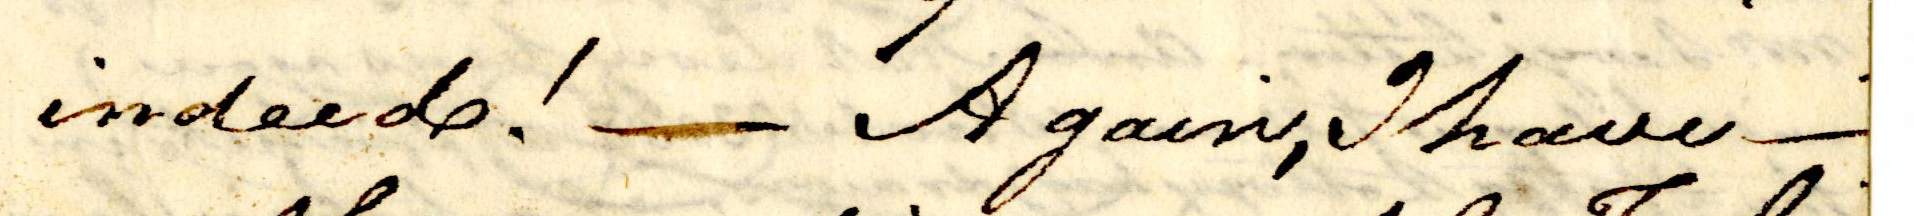indeed!- Again, I have-
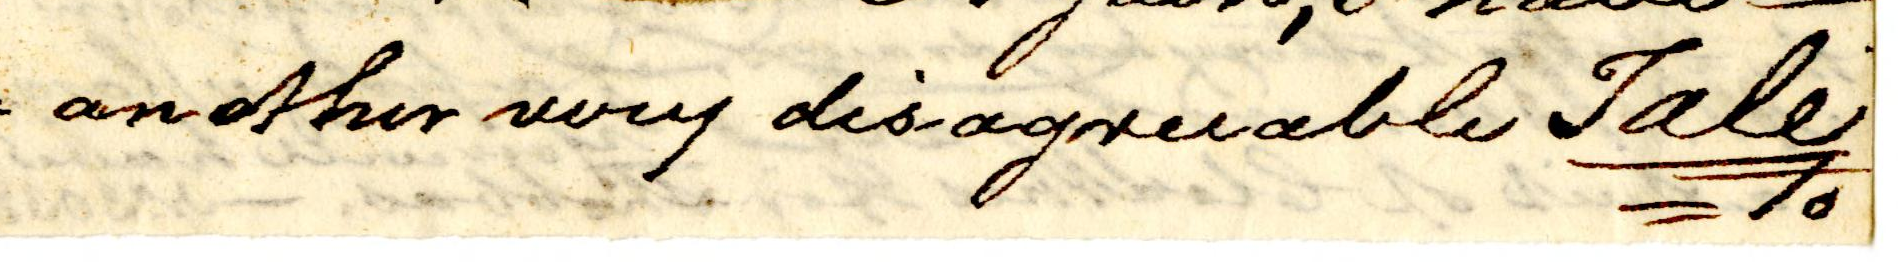another very disagreeable Tale
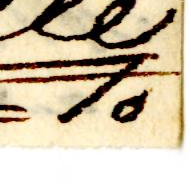to
